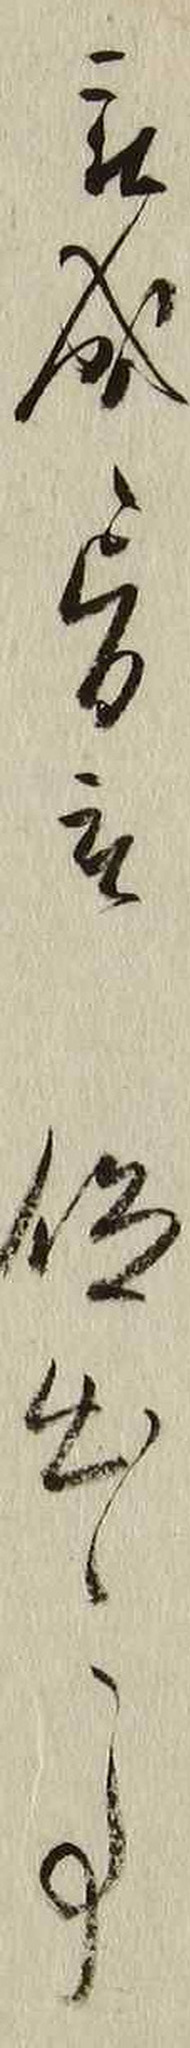被成候旨被仰出候事
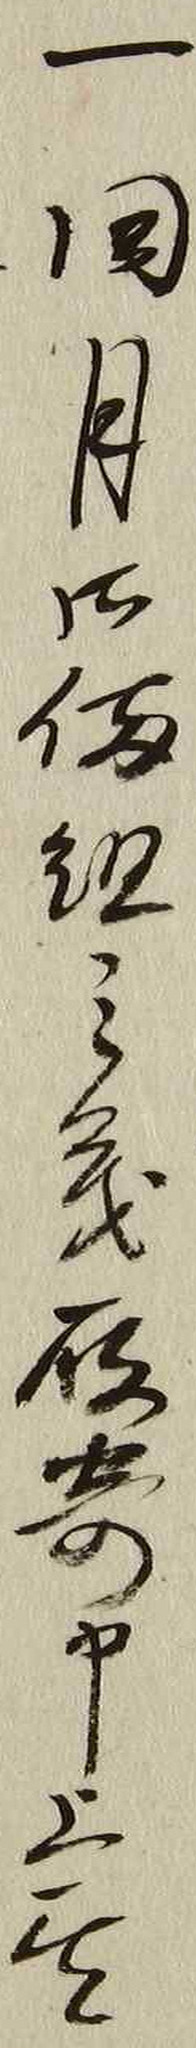一同月御備組之義存寄申上其
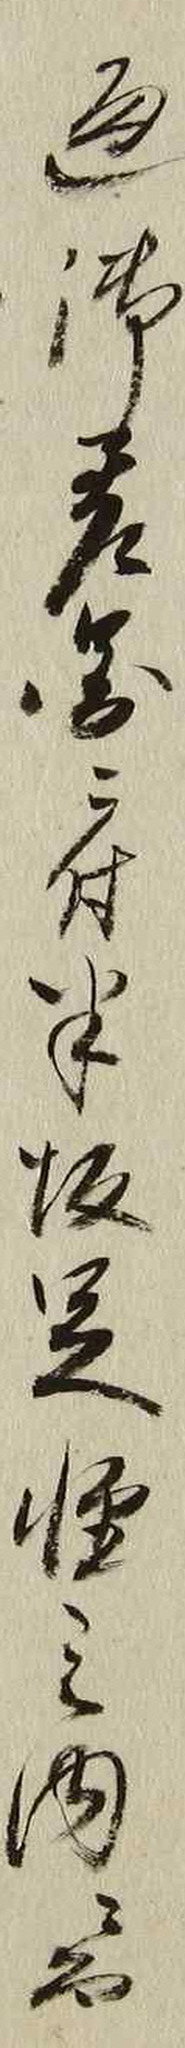通御差図ニ付半坂足軽之内ニ而
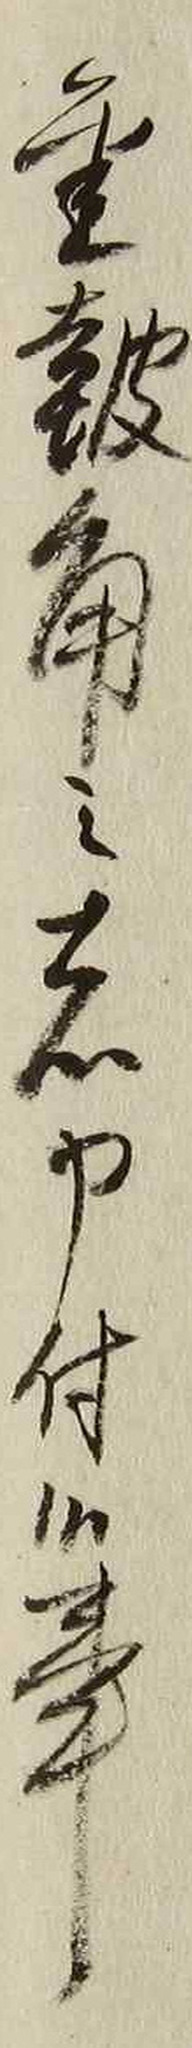金報角之者申付候事
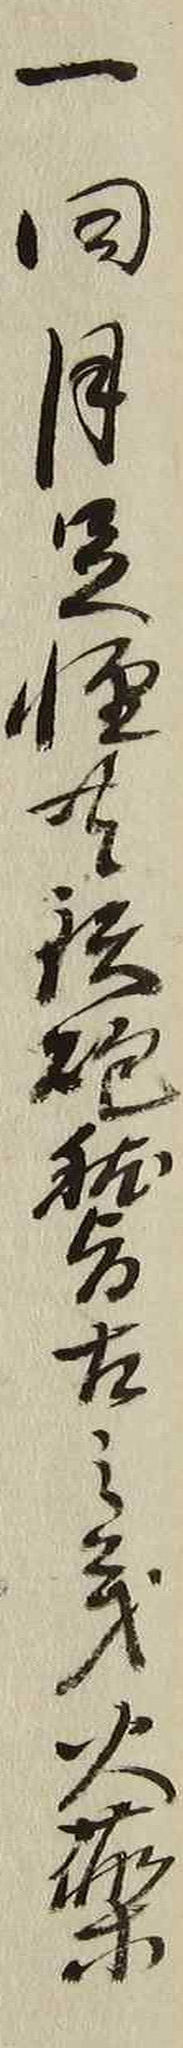一同月足軽共鉄砲稽古之義火薬
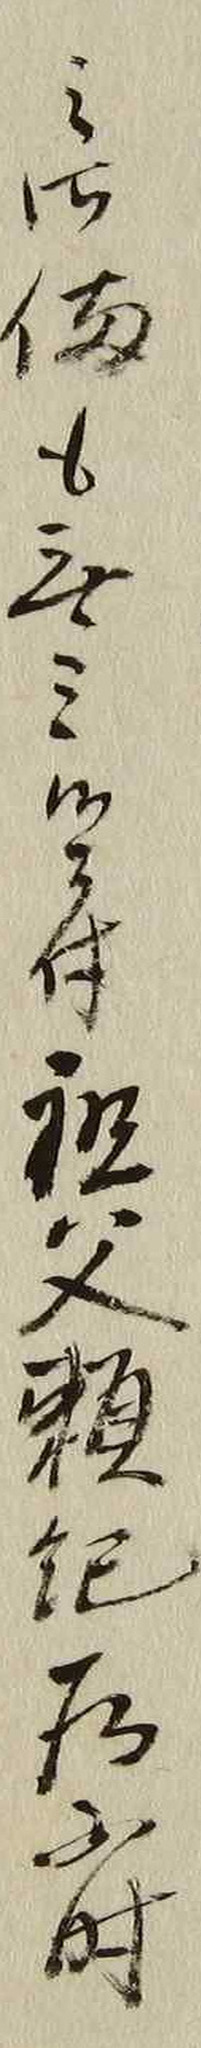之御備も無之候ニ付祖父頼紀為不時
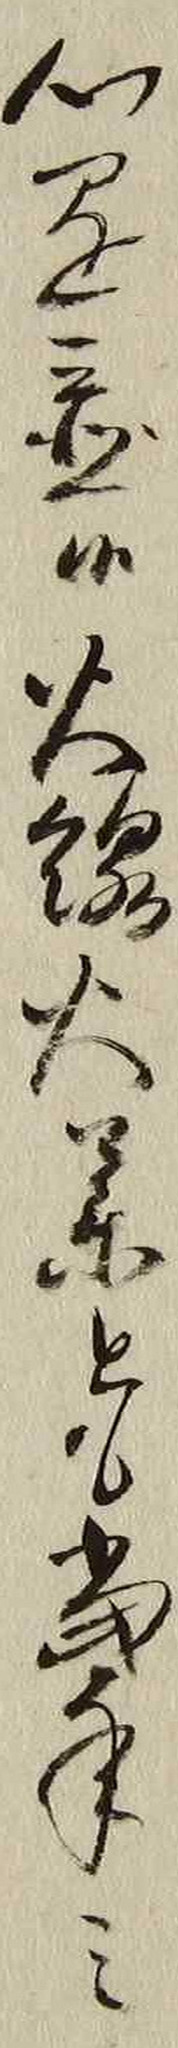心懸置候火線火薬とも当年之
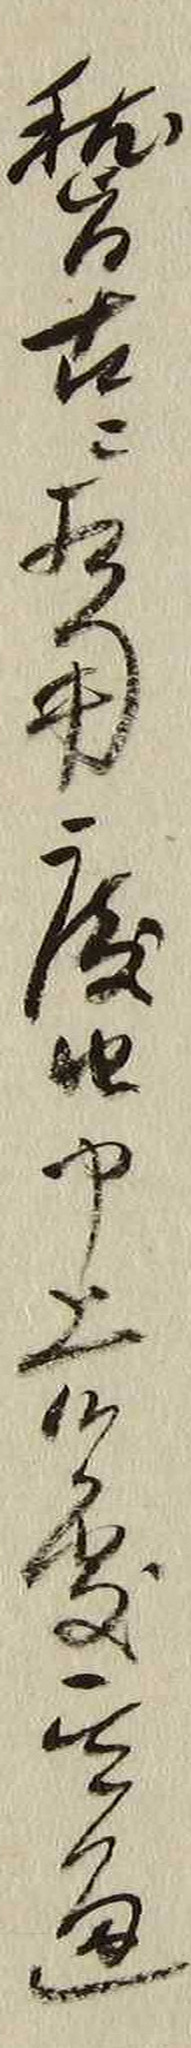稽古ニ相用度由申上候処其通
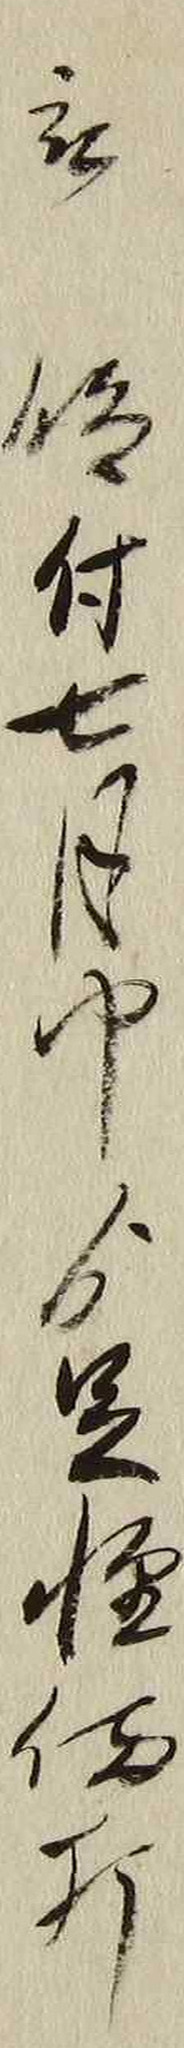被仰付七月中ゟ足軽備打
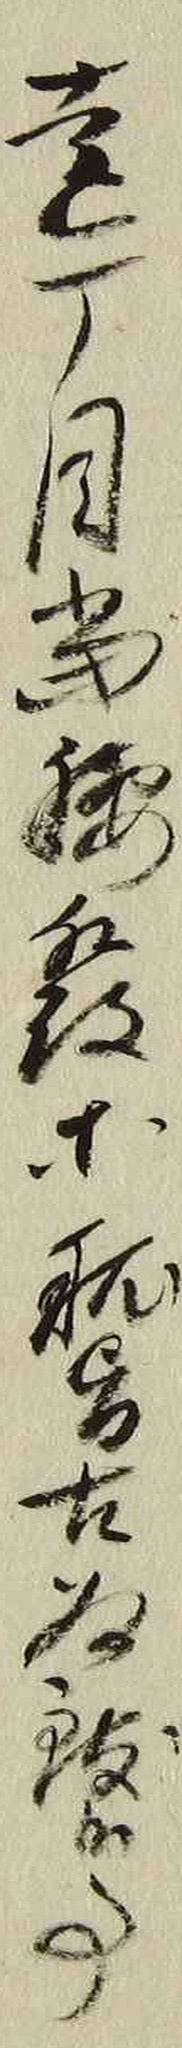遠丁目当腰発等稽古為致候事
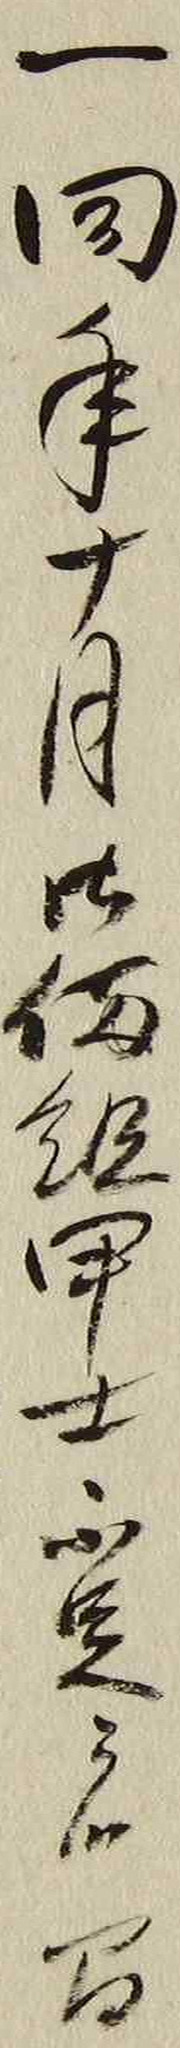一同年十月御備組甲士不足ニ候間
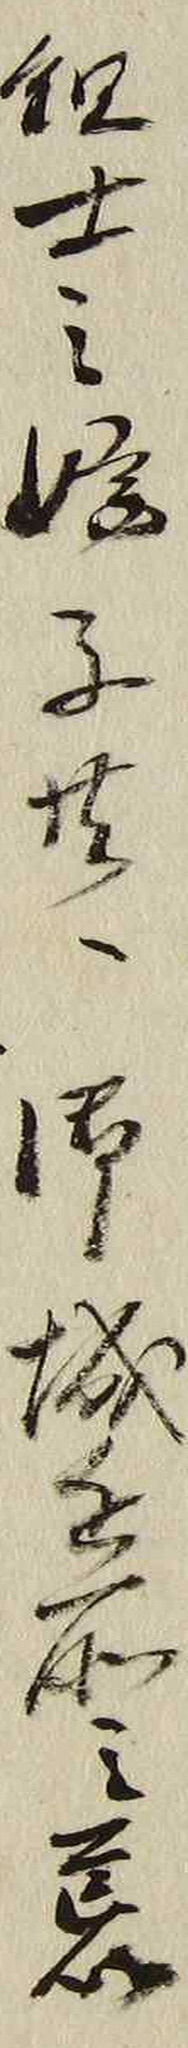組士之嫡子共へ御城近所之荒
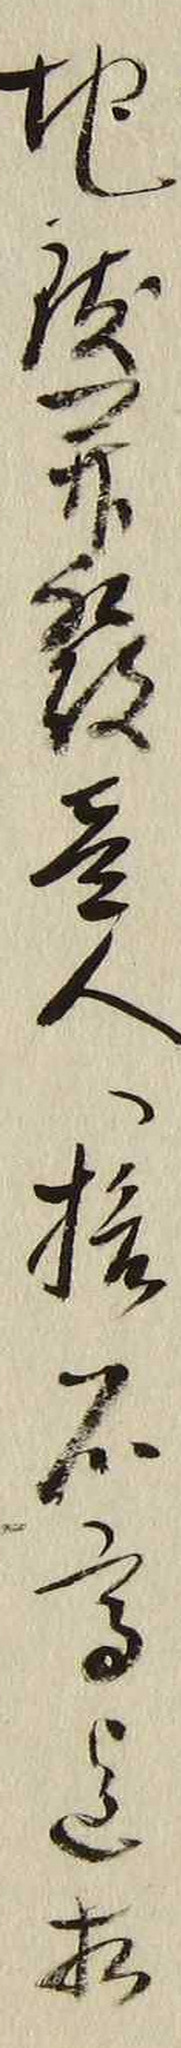地致開発壱人へ拾石高迄相
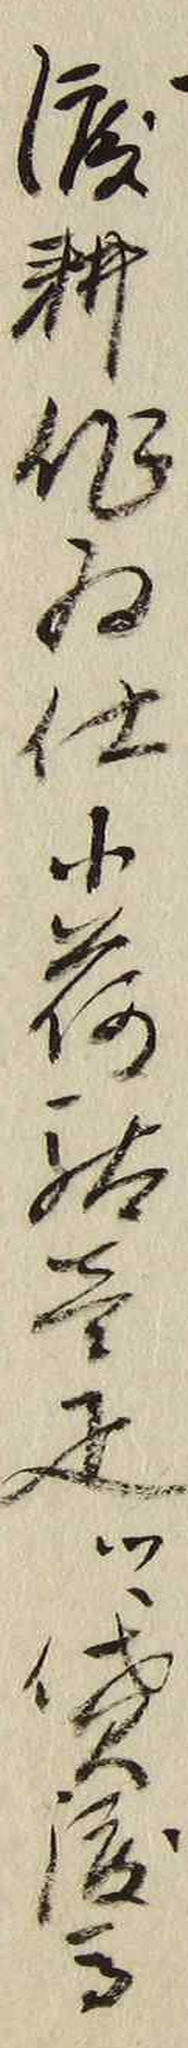渡耕作為仕小荷駄壱疋ツヽ貸渡馬

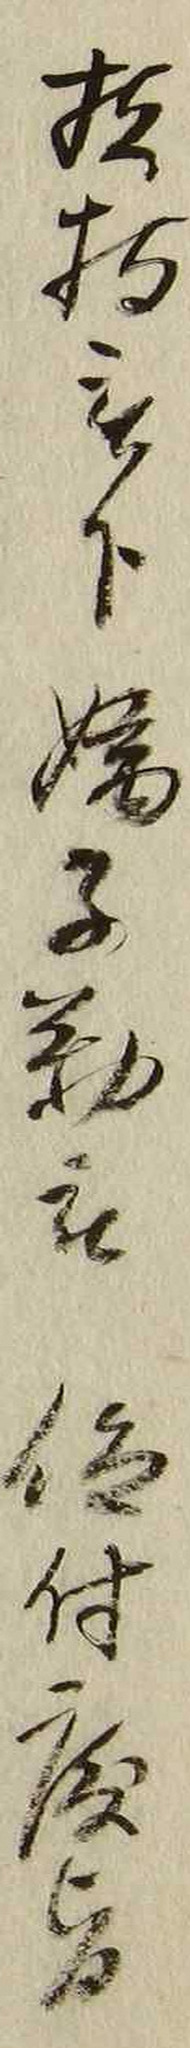扶持被下嫡子勤被仰付度旨
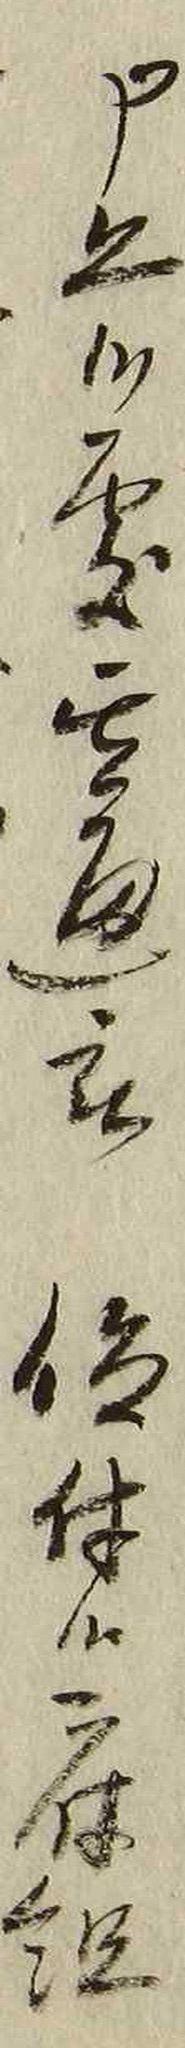申上候処其通被仰付候ニ付組
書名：諸士系譜　巻之351　す之部1
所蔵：会津若松市立会津図書館
